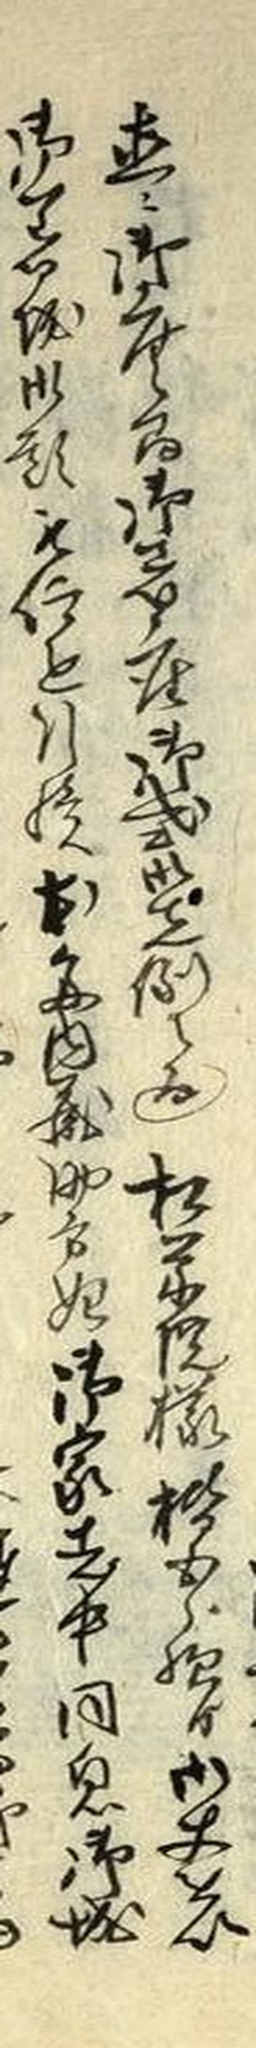御着城御歓被仰進引続本多内蔵助方始御家老中同息御城
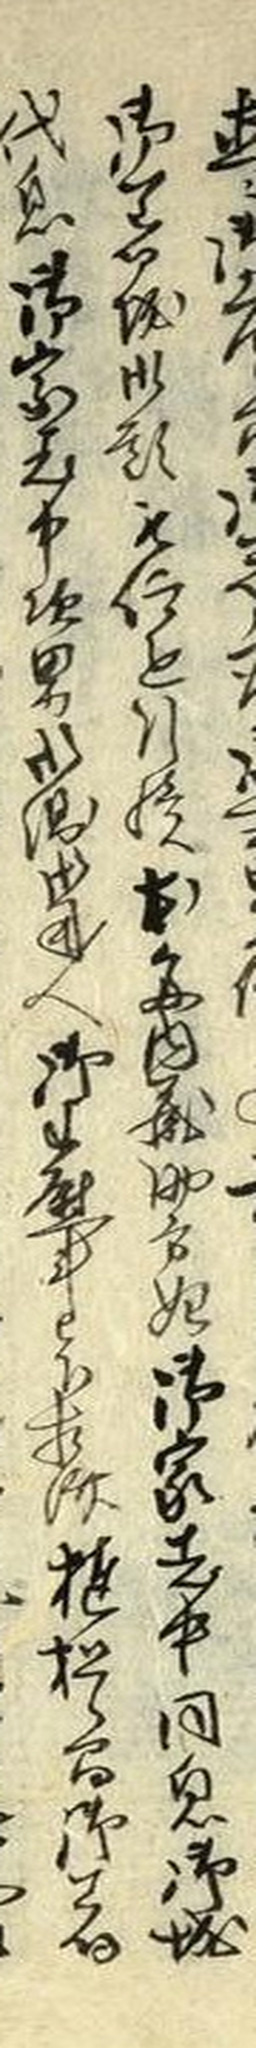代息御家老中次男御側御用人御手熨斗被下相済韃靼之間御着
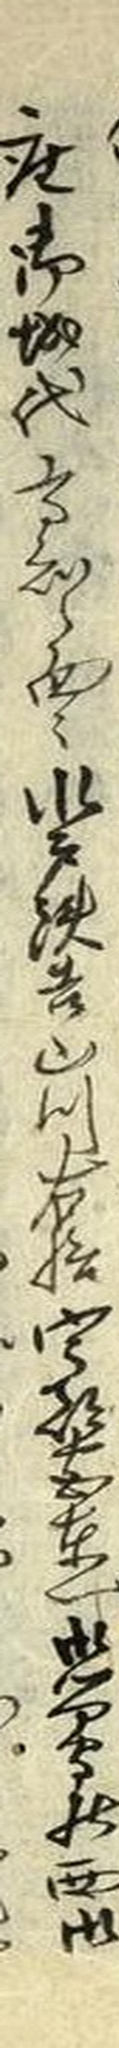座御城代高知之面々水戸鉄吉山川右膳宇都宮東一御留守居西御
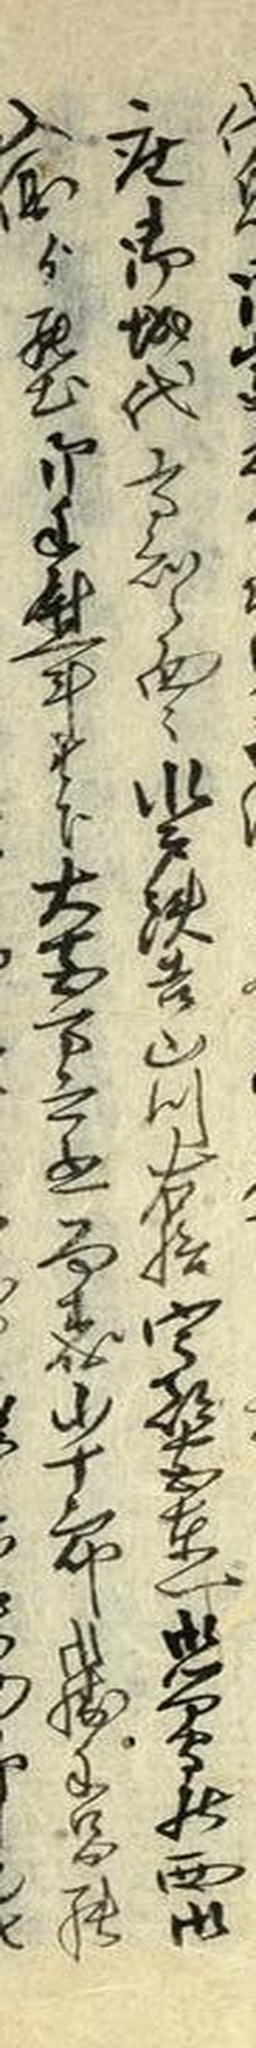入側ゟ罷出御手熨斗被下大宮万之丞雨森小十郎御勝手口ゟ罷
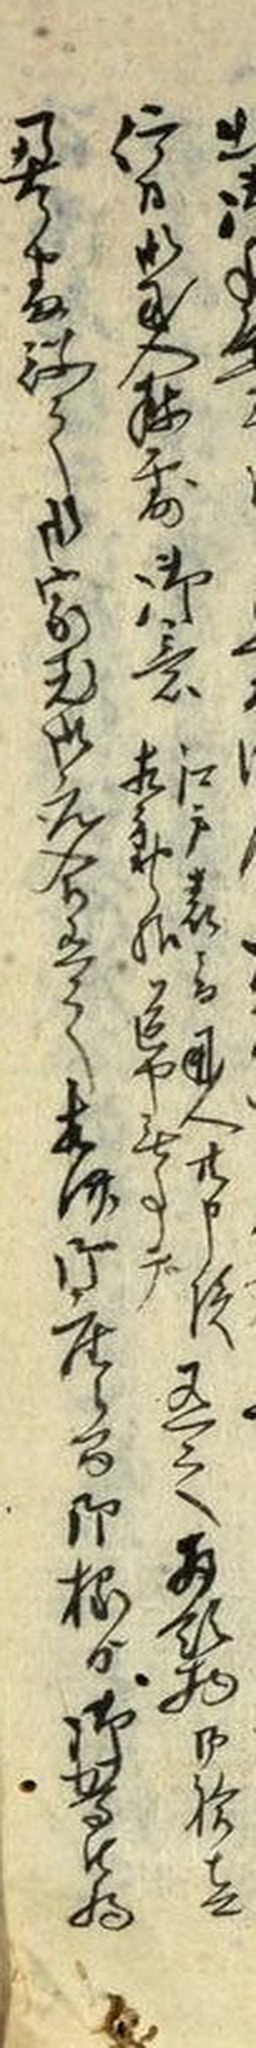奥番役之御家老御取合有之相済御座之間御椽ゟ御駕被為

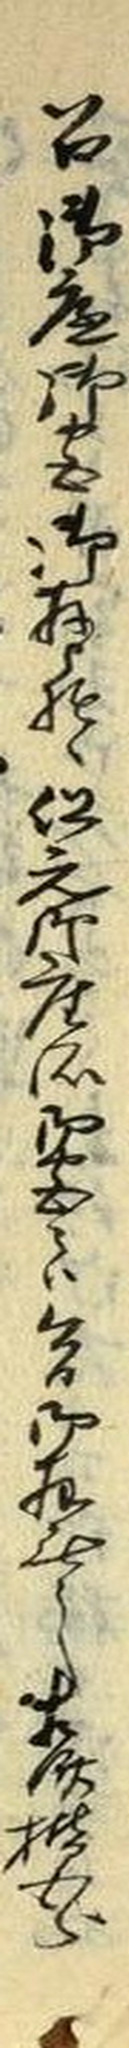召御庭御宮御拝被遊候但元御座所御宮ニハ今日御拝無之相済楷五郎
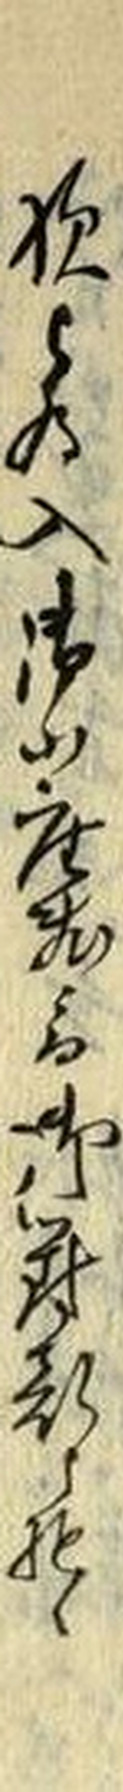様被為入御小座敷ニ而御対顔被遊候
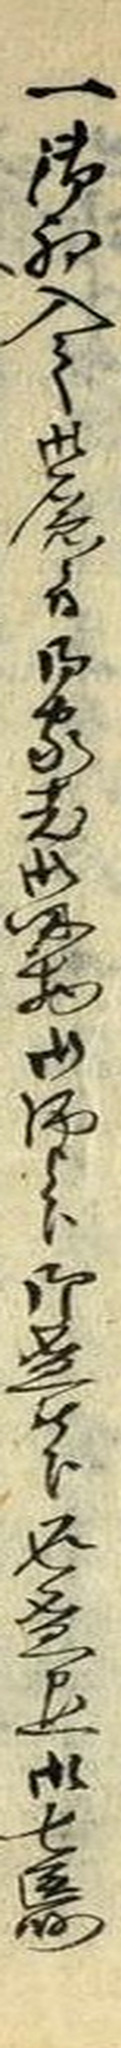一御初入之御廉ニ付御家老御吸物御酒被下御盃被下返盃申上御匕医師
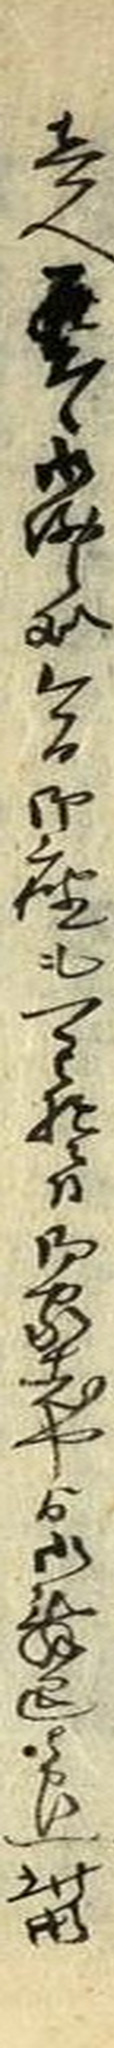壱人罷出候御例之処今日御座も可被遊候付御家老中ゟ御辞退被申上此御
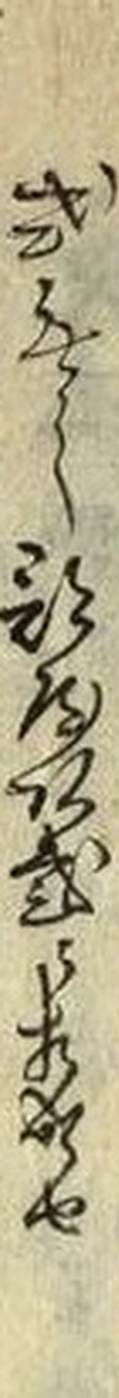式無之部屋頂戴ニ相成候由
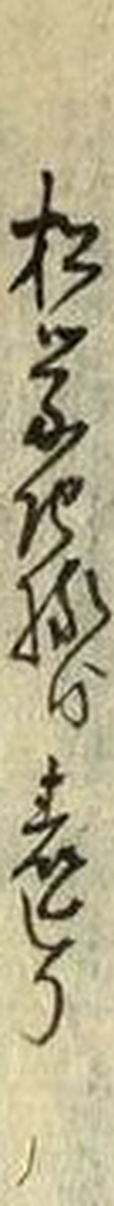松栄院様ゟ表廻り
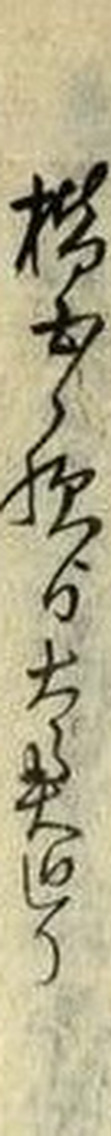楷五郎様ゟ大奥廻り
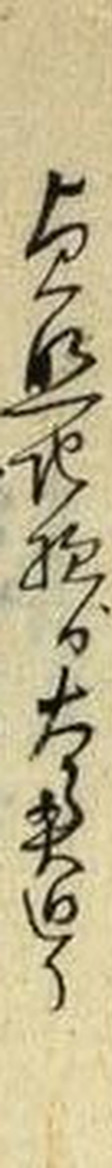貞照院様ゟ大奥廻り
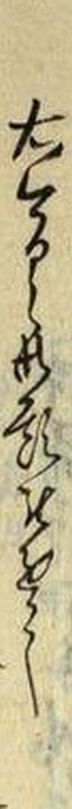右今日之御歓被進之
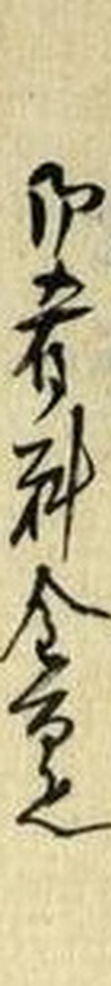御肴料金百疋
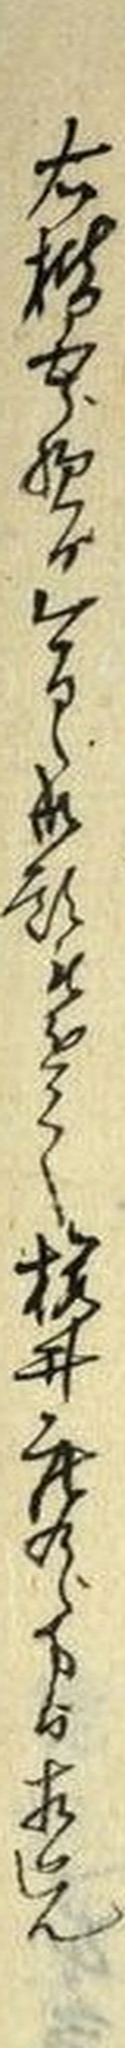右楷五郎様ゟ今日之御歓被進之桜井庄九郎方ゟ相廻ㇽ
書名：少傅日録抄（斉善付側向頭取日記、江戸并道中、初入在国、逝去後…
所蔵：福井県文書館 Fukui Prefectural Archives
